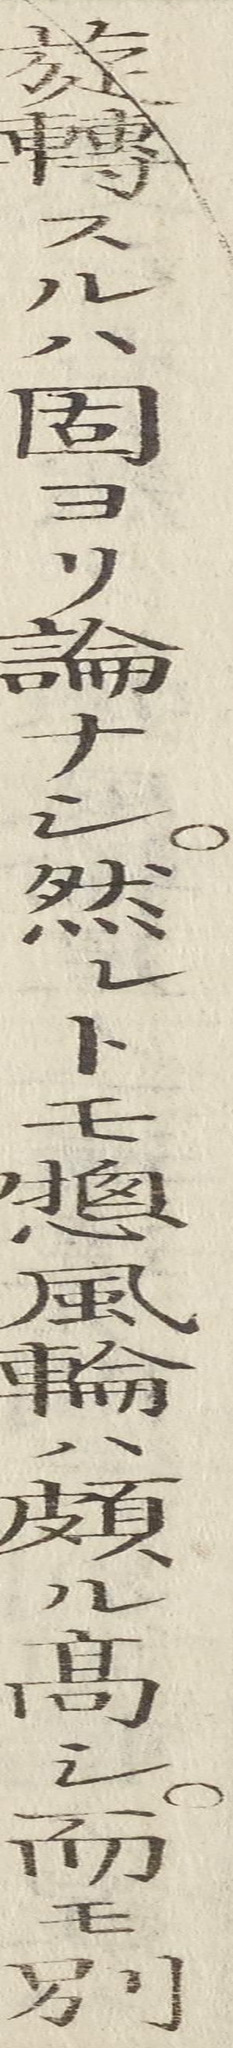旋転スルハ固ヨリ論ナシ。然レトモ惣風輪ハ頗ル高シ。而モ別
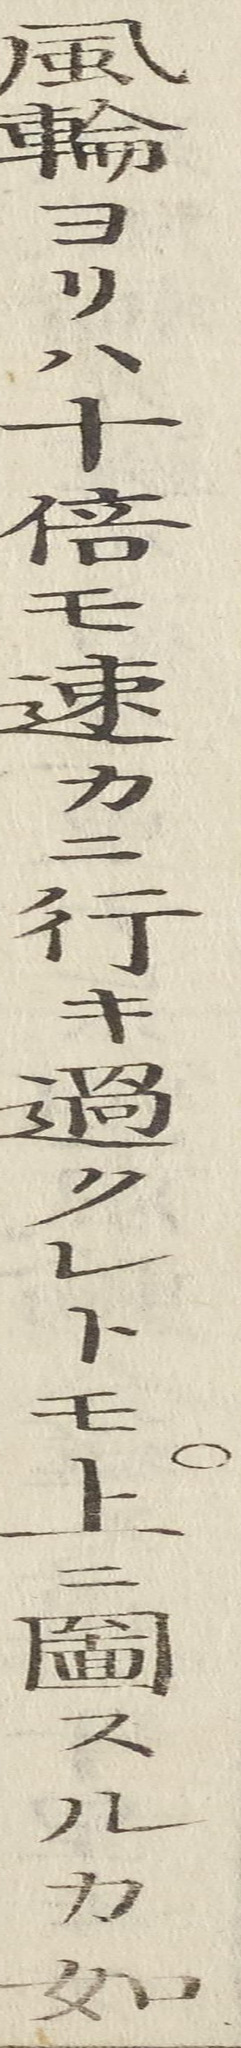風輪ヨリハ十倍モ速カニ行過クレトモ。上ニ図スルカ如
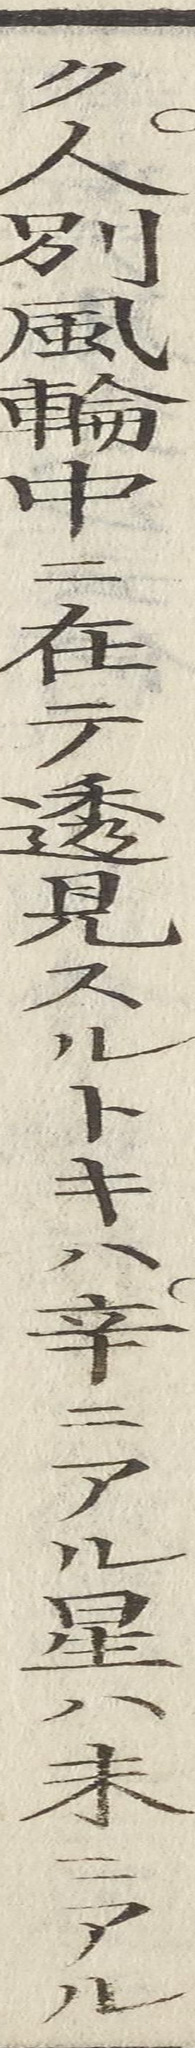ク。人別風輪中ニ在テ透見スルトキハ。辛ニアル星ハ末ニアル
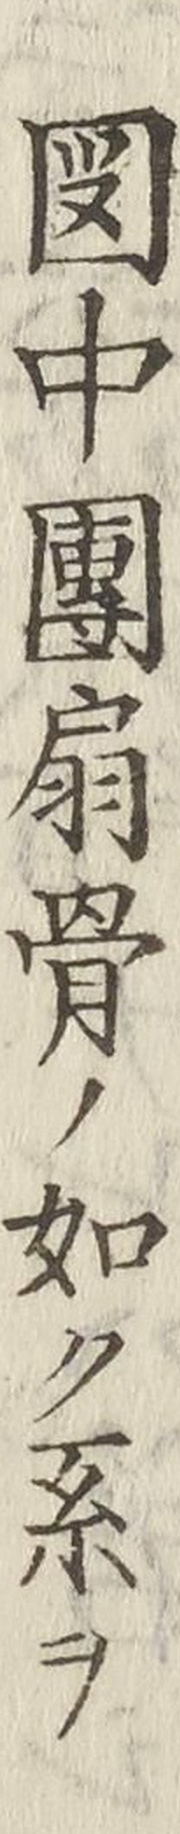図中団扇骨ノ如ク系ヲ
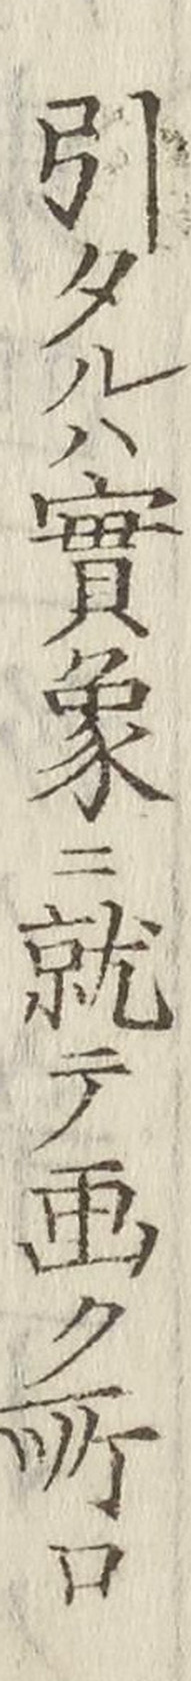引タルハ実象ニ就テ画ク所ロ
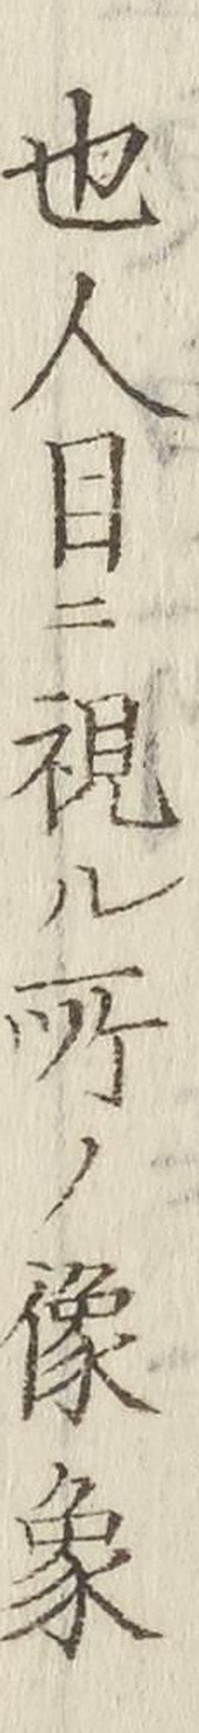也人目ニ視ル所ノ像象
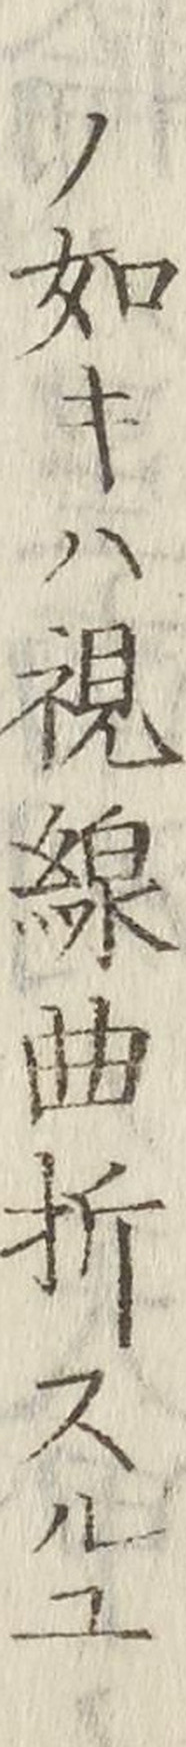ノ如キハ視線曲折スルユ
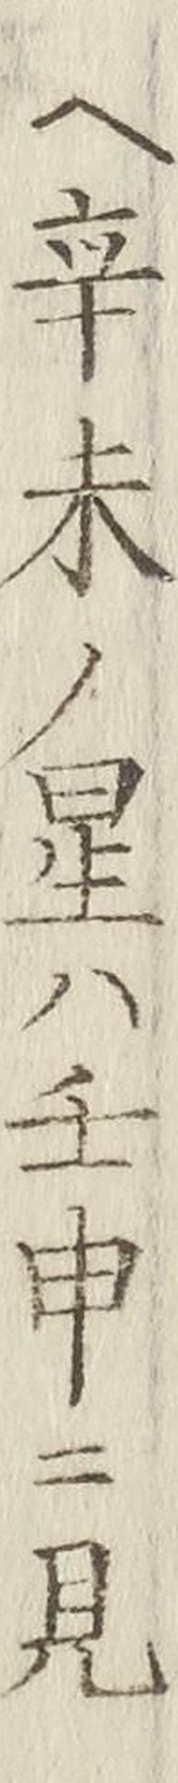ヘ辛末ノ星ハ壬申ニ見
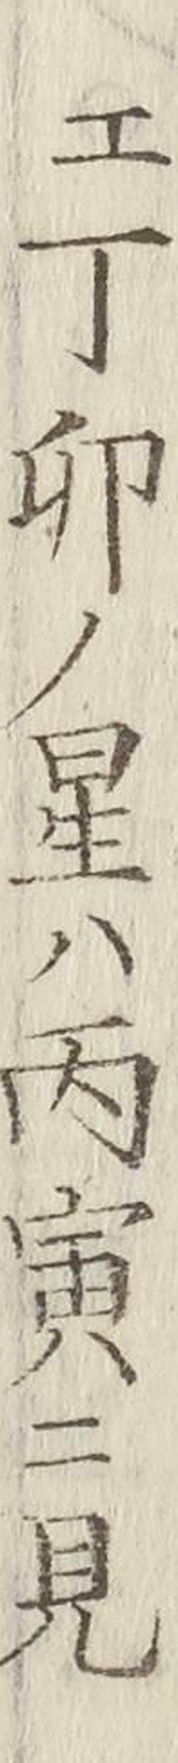エ丁卯ノ星ハ丙寅ニ見
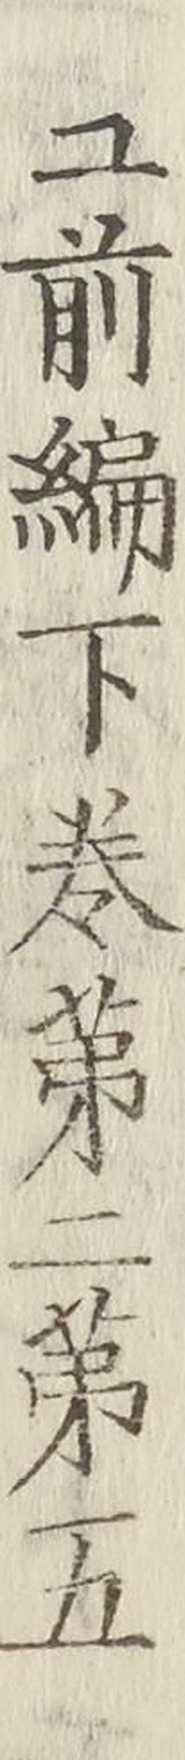ユ前編下巻第ニ第五
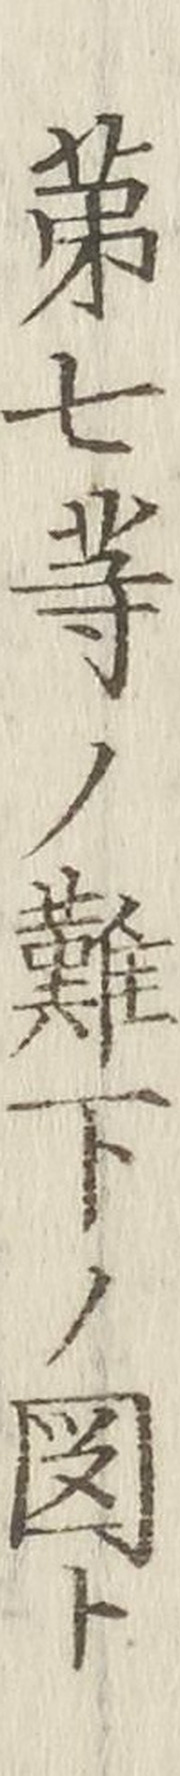第七等ノ難下ノ図ト
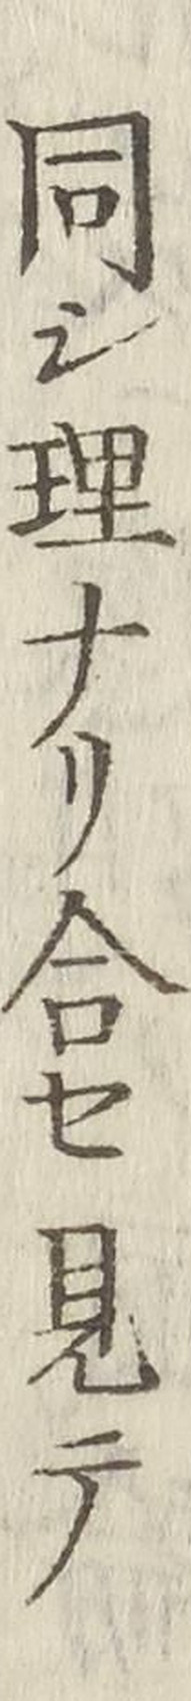同シ理ナリ合セ見テ
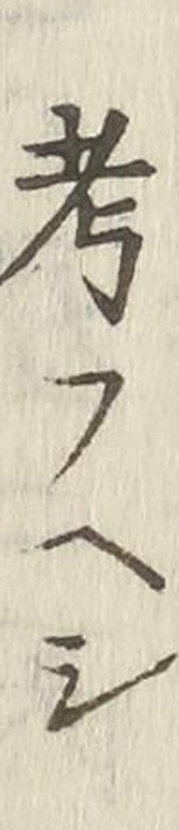考フヘシ

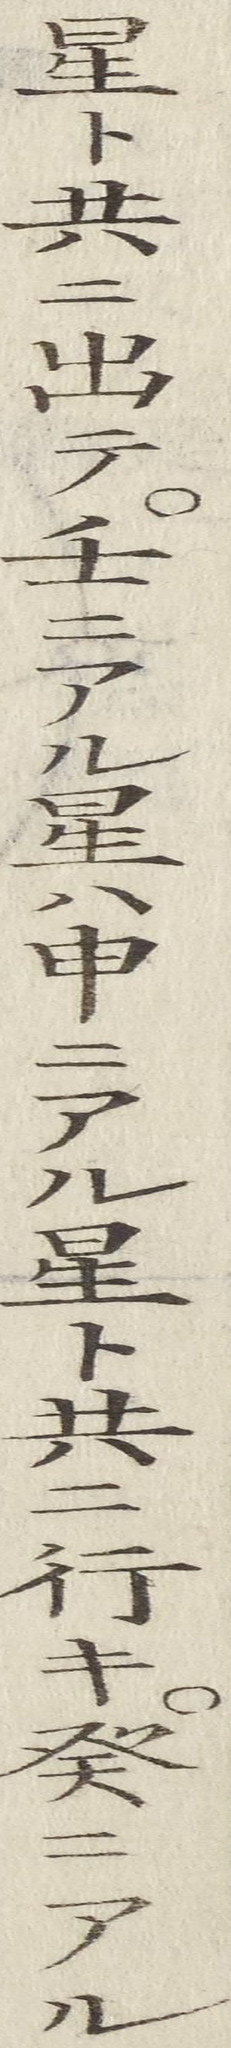星ト共ニ出テ。壬ニアル星ハ申ニアル星ト共ニ行キ。癸ニアル
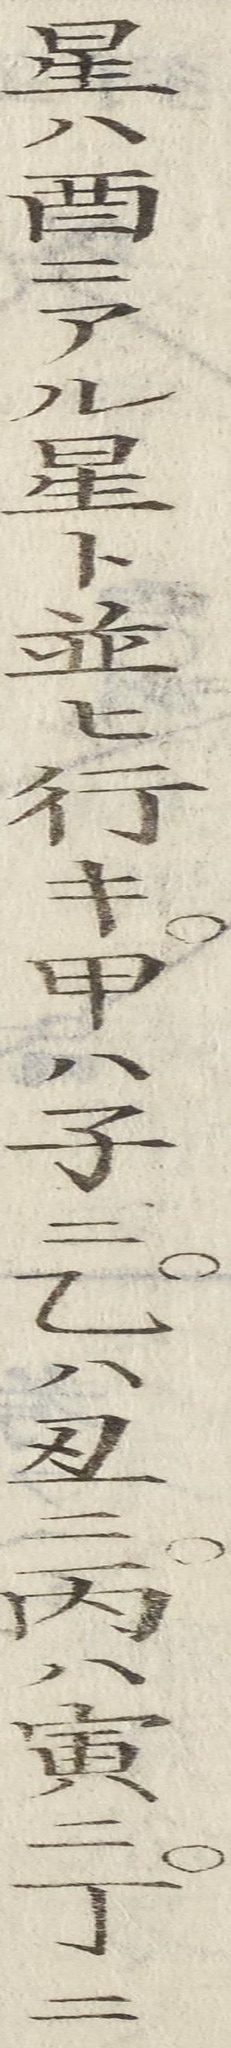星ハ酉ニアル星ト並ヒ行キ。甲ハ子ニ。乙ハ丑ニ。丙ハ寅ニ。丁ニ
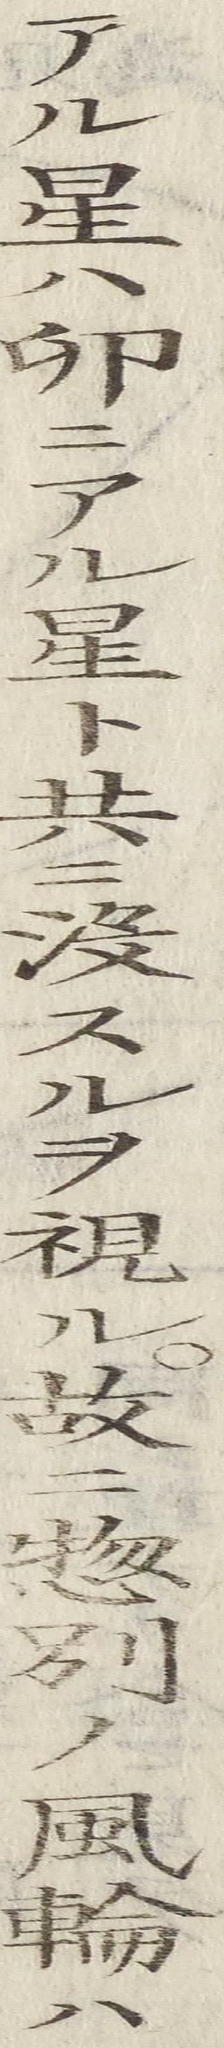アル星ハ卯ニアル星ト共ニ没スルヲ視ル。故ニ惣別ノ風輪ハ
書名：護法新論　二編　上
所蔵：東京大学地震研究所図書室 Earthquake Research Institute Library, The University of Tokyo, JAPAN
